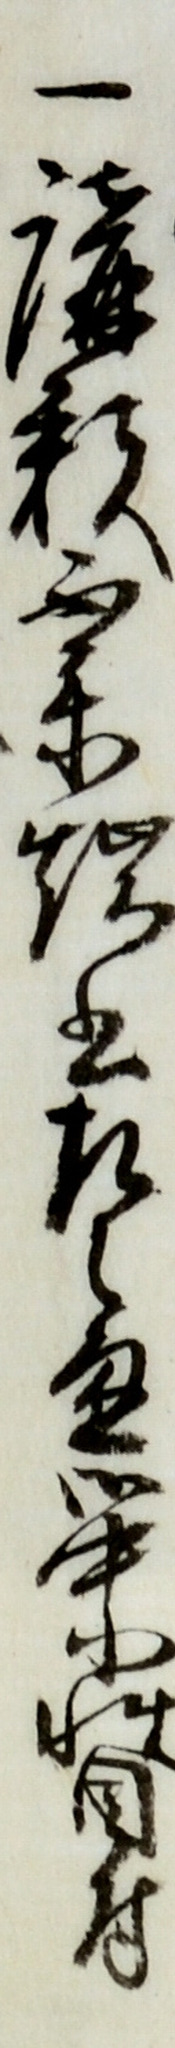一講釈不参端書左之通御中小性目付
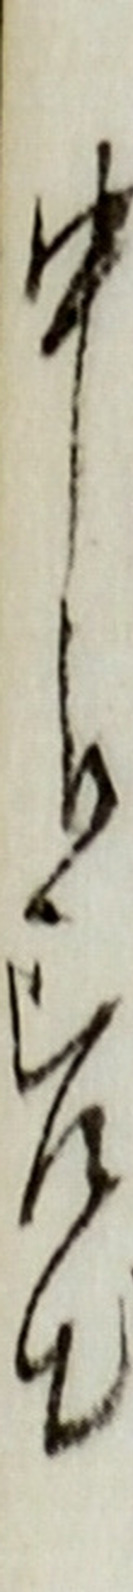中江差出

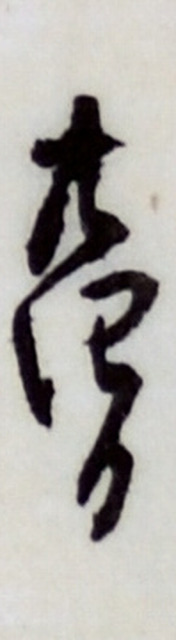廿六日
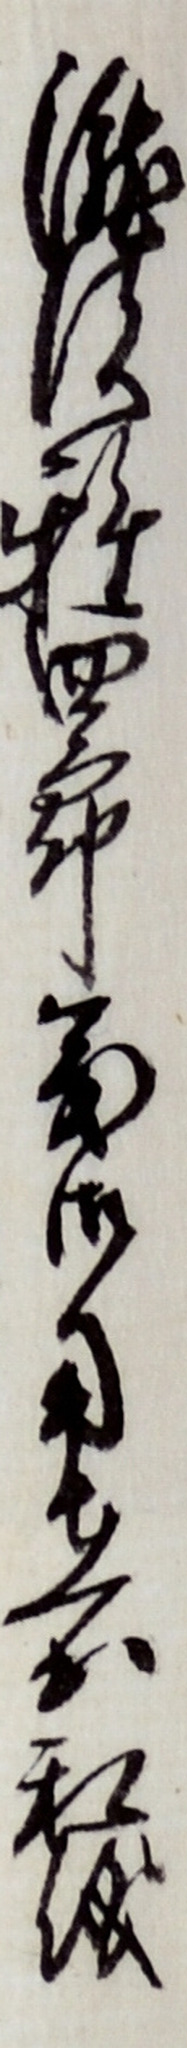瀧沢雅四郎義御用在出私儀
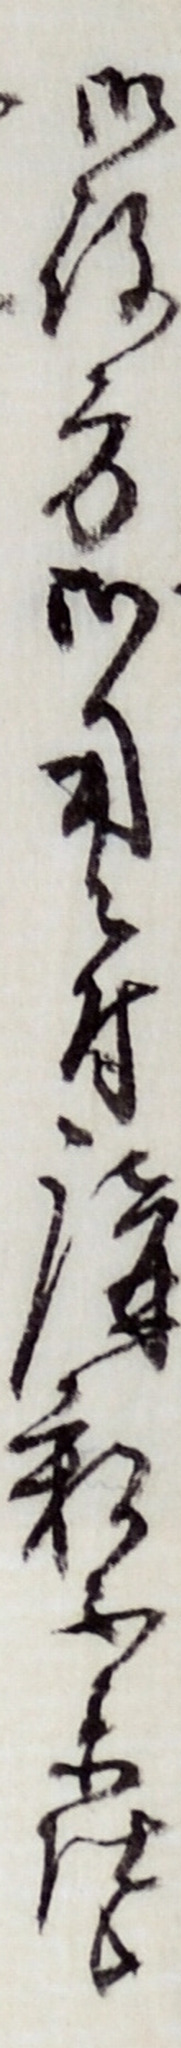御役方御用ニ付講釈不参仕候
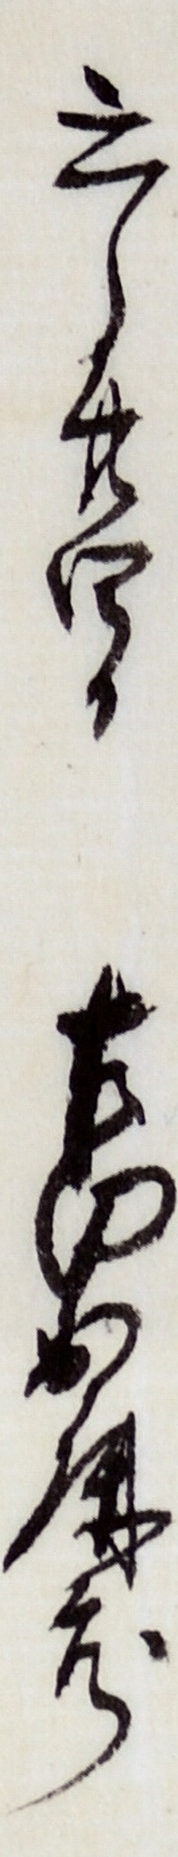六月廿四日古田麗蔵
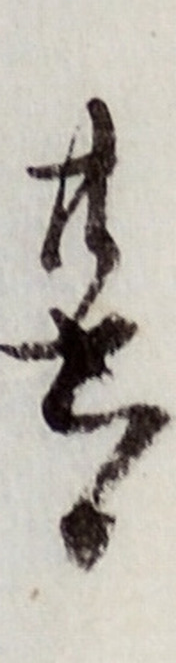廿六日
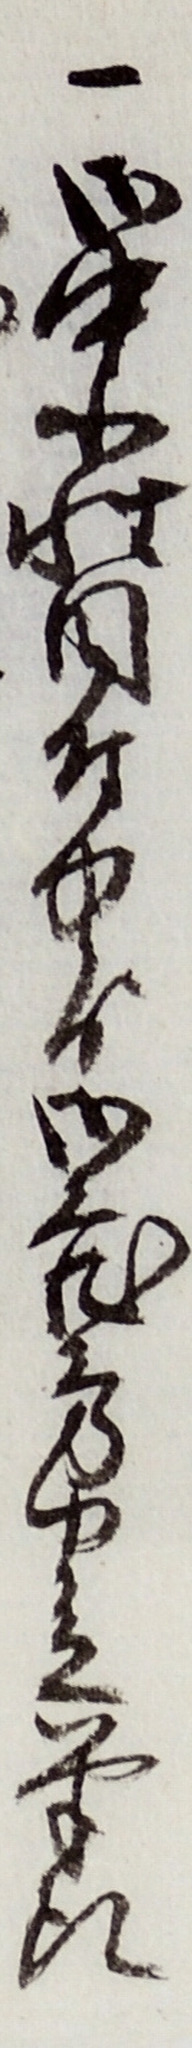一御中小性目付中ゟ御蔵方申立筆頭
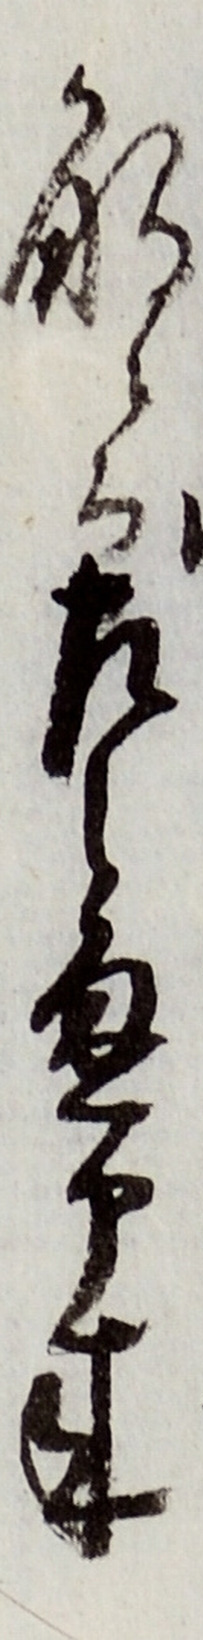触ニ而左之通申来
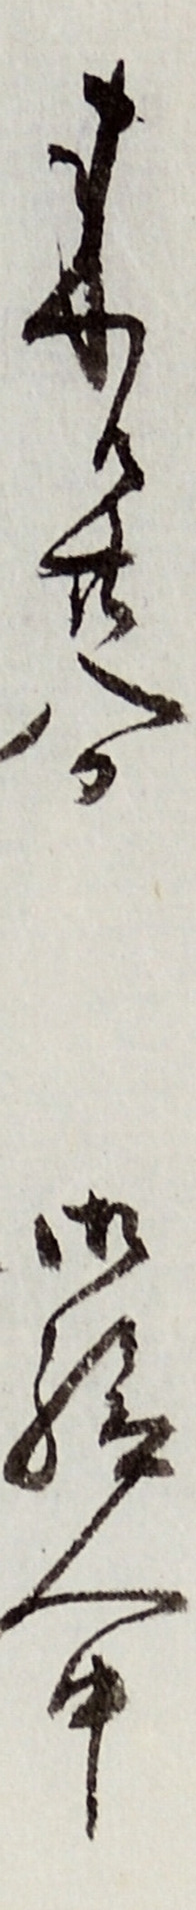来ル廿八日御給人中
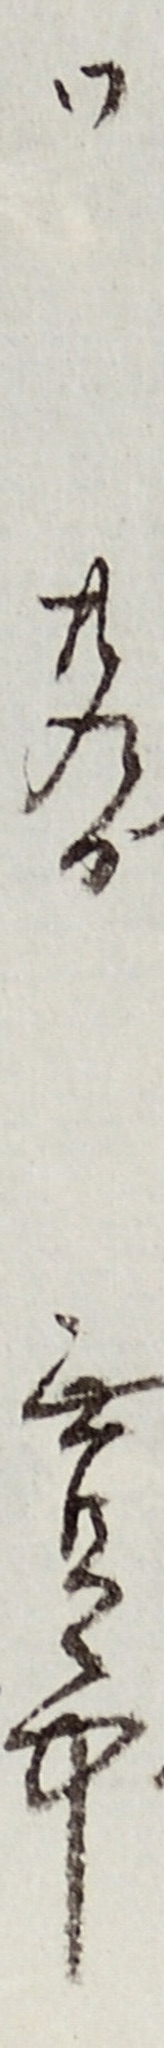同廿九日無足中
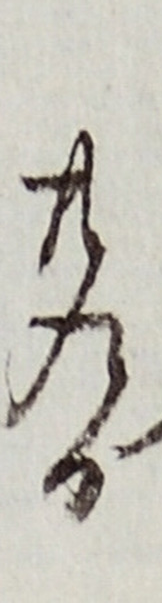廿六日
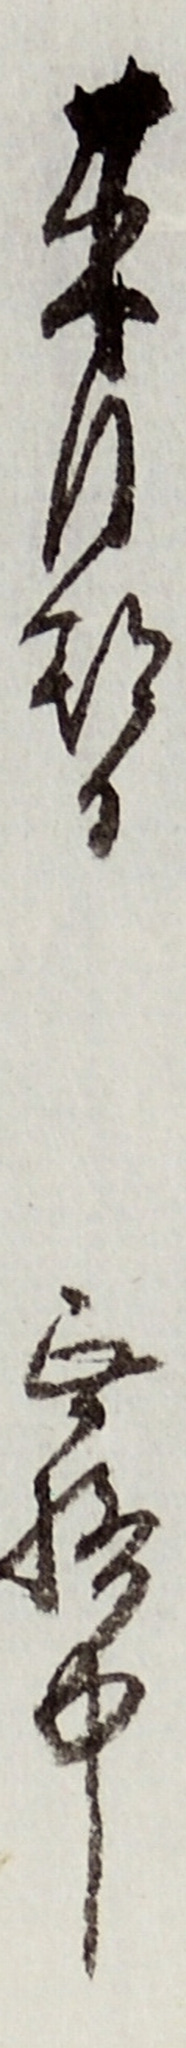来月朔日無給中
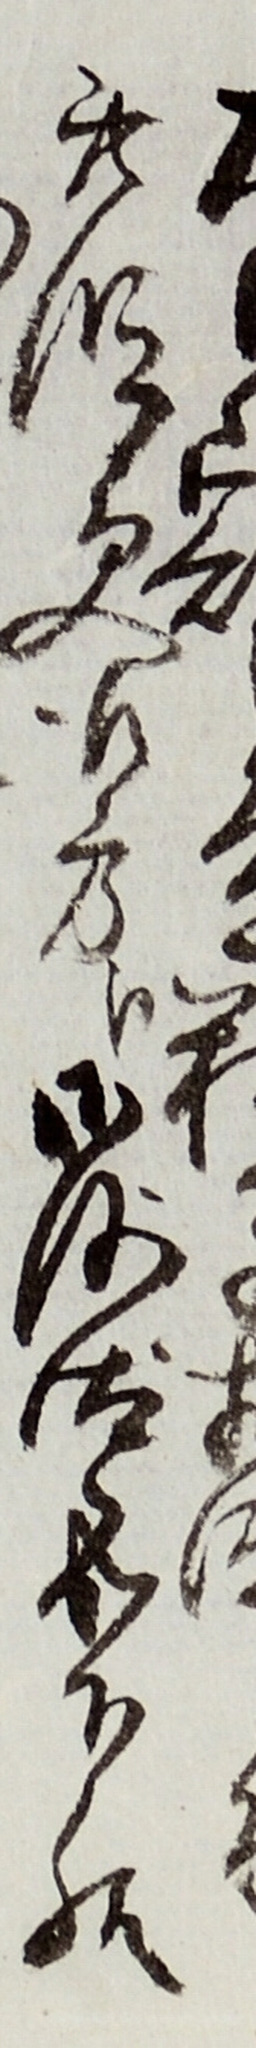此段受取方江御沙汰被成下候様
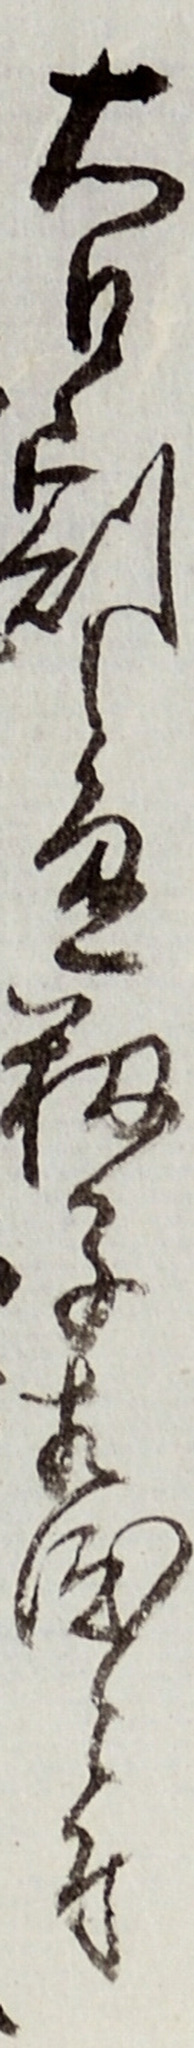右日割之通籾子相渡候ニ付
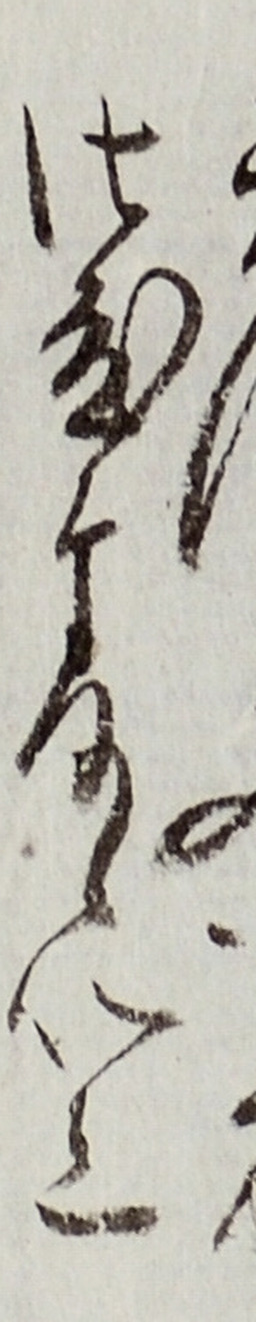仕度奉存候以上
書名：御山方御薪方諸事御用留
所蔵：伊那市立高遠町図書館・合同会社AMANE
